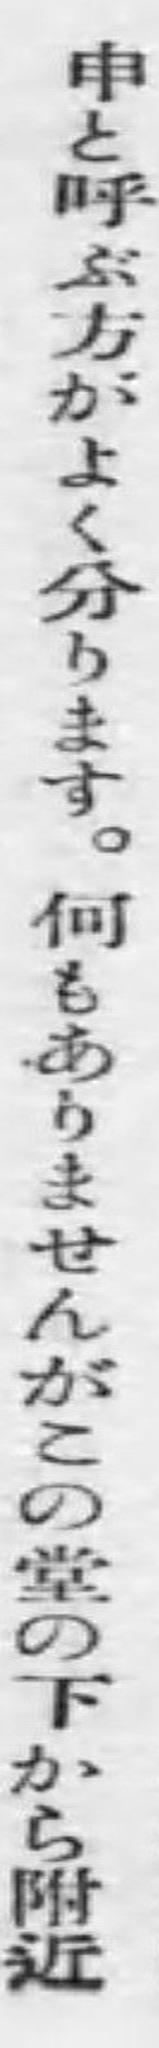申と呼ぶ方がよく分ります。何もありませんがこの堂の下から附近
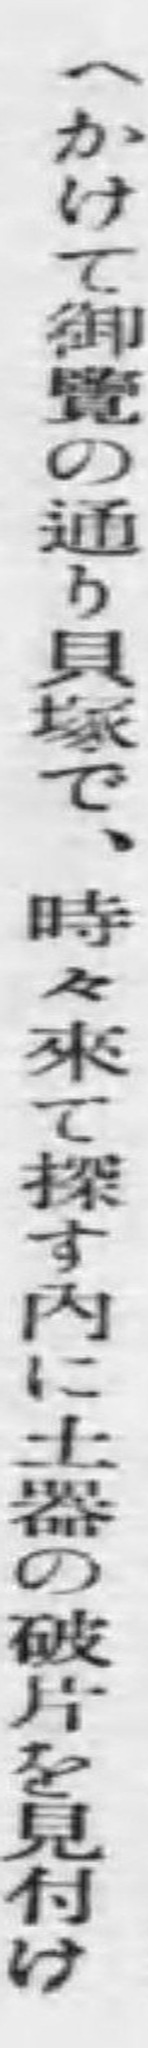へかけて御覧の通り貝塚で、時々来て探す内に土器の破片を見付け
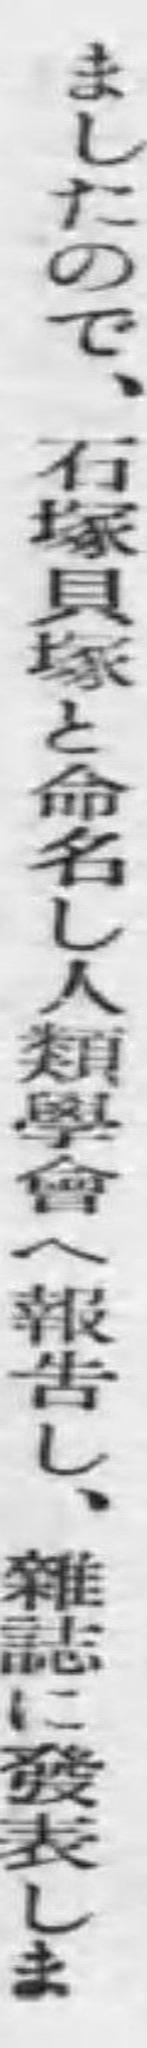ましたので、石塚貝塚と命名し人類学会へ報告し、雑誌に発表しま
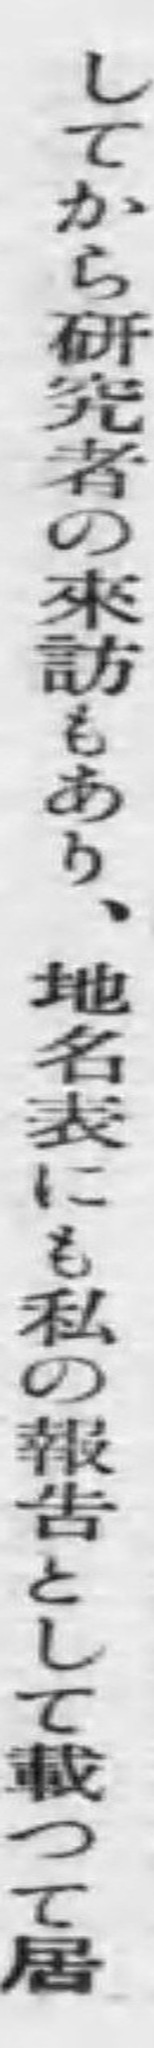してから研究者の来訪もあり、地名表にも私の報告として載つて居
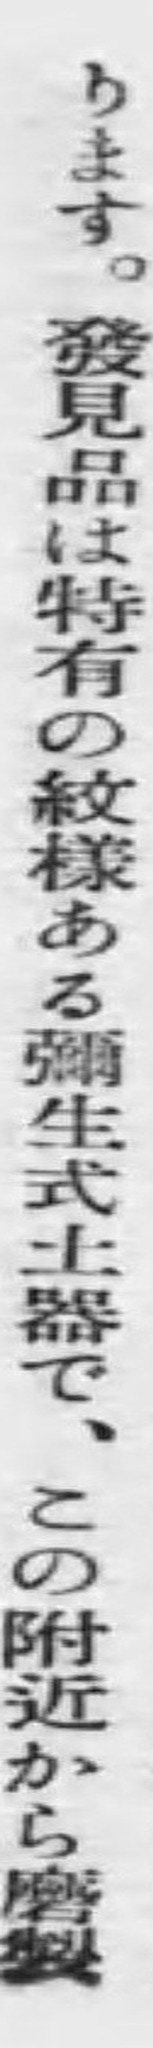ります。発見品は特有の紋様ある弥生式土器で、この附近から磨製
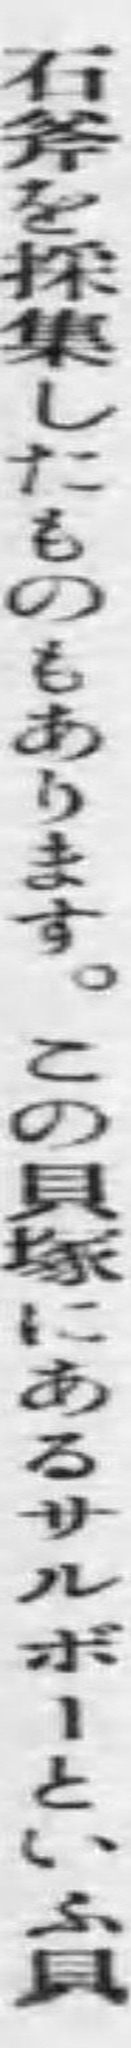石斧を採集したものもあります。この貝塚にあるサルボーといふ貝
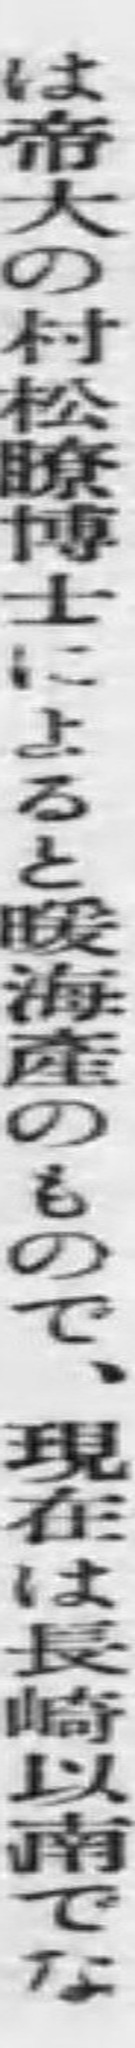は帝大の村松瞭博士によると暖海産のもので、現在は長崎以南でな
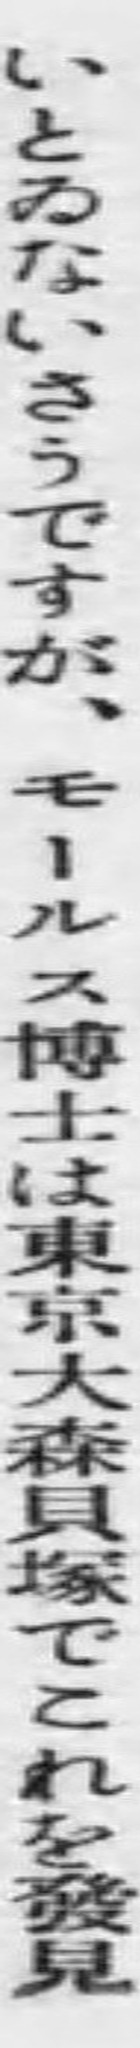いとゐないさうですが、モールス博士は東京大森貝塚でこれを発見
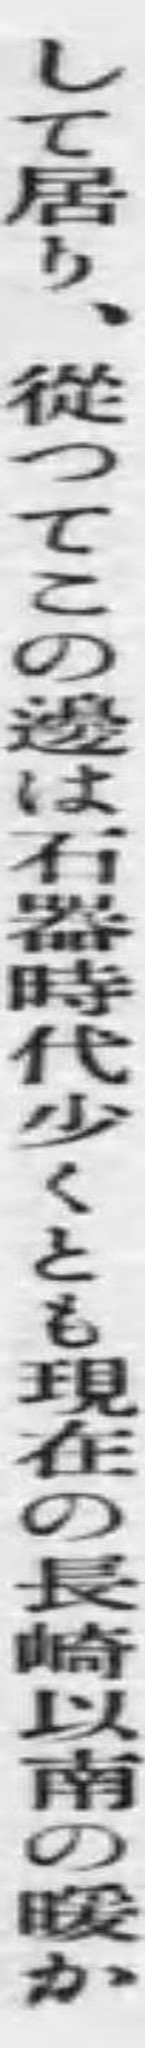して居り、従つてこの辺は石器時代少くとも現在の長崎以南の暖か
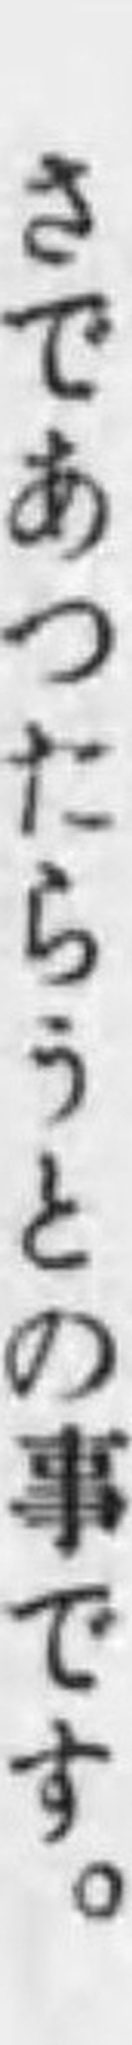さであつたらうとの事です。
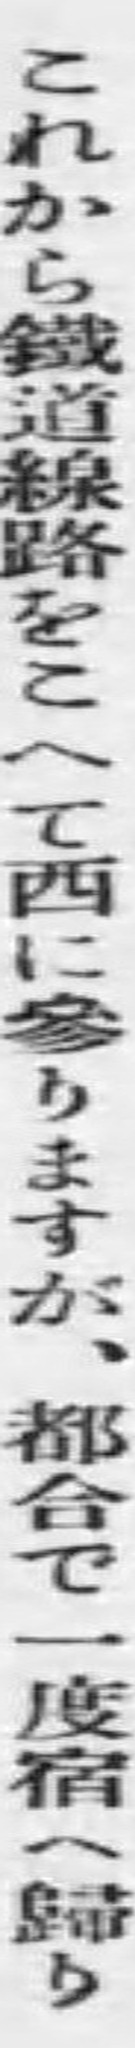これから鉄道線路をこへて西に参りますが、都合で一度宿へ帰り
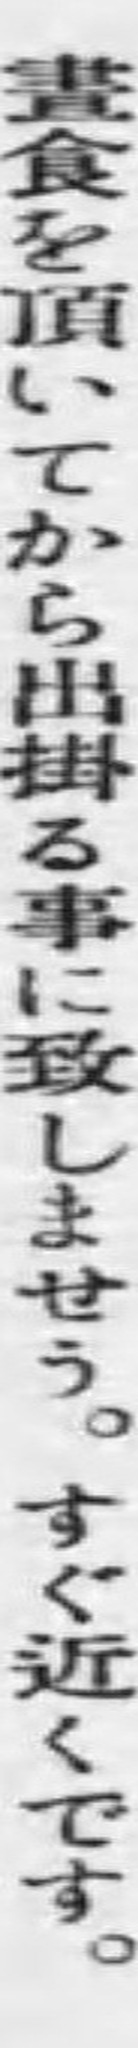昼食を頂いてから出掛る事に致しませう。すぐ近くです。
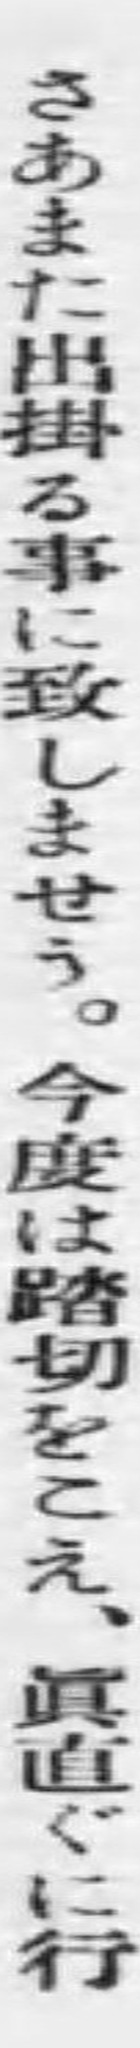さあまた出掛る事に致しませう。今度は踏切をこえ、真直ぐに行
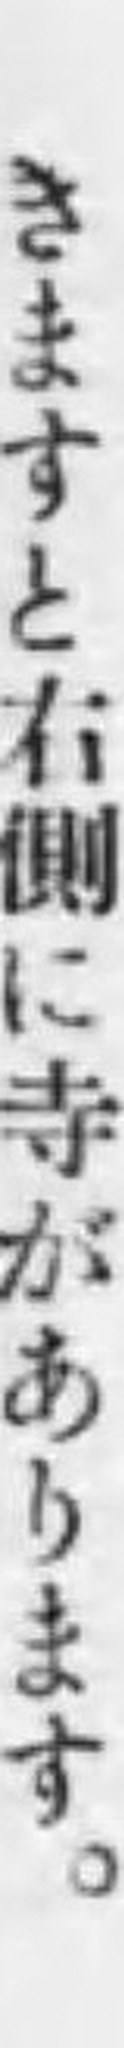きますと右側に寺があります。
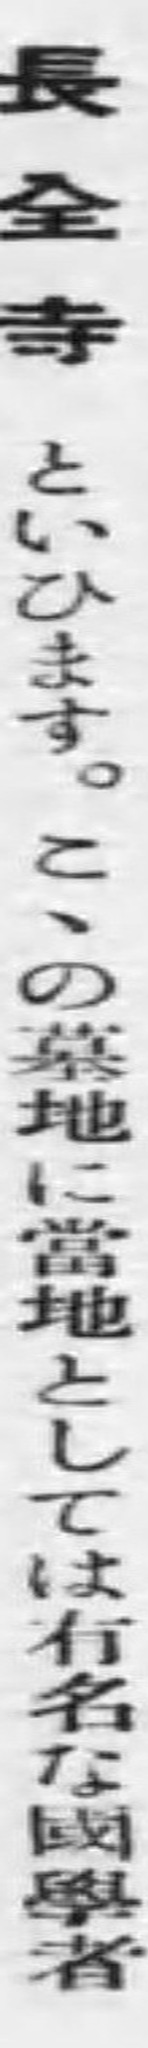長全寺といひます。こゝの墓地に当地としては有名な国学者
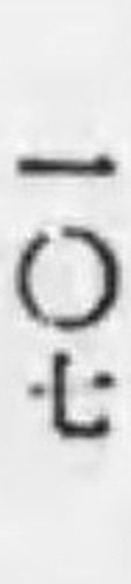一〇七
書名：東三河道中記 : 豊橋市及其附近案内
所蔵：国立国会図書館 National Diet Library, JAPAN
